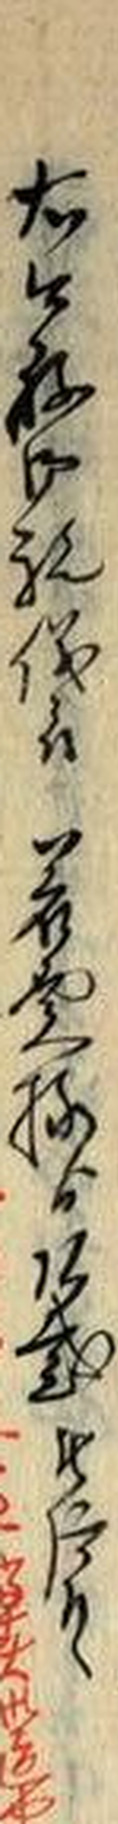右今般御祝儀ニ付若殿様ゟ頂戴被仰付候
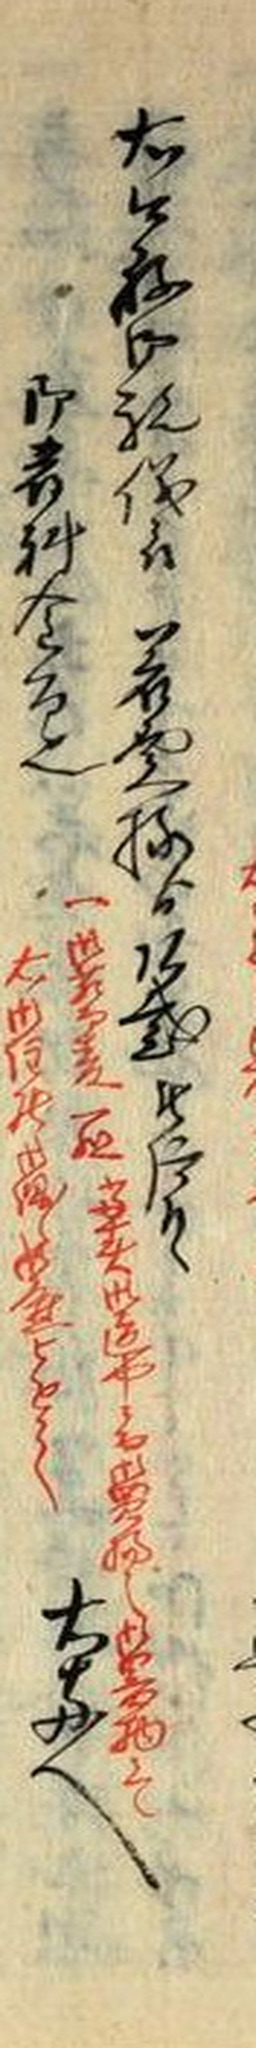御肴料金百疋右両人へ
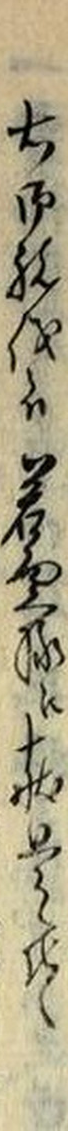右御祝儀ニ付若殿様へ献上之仕候
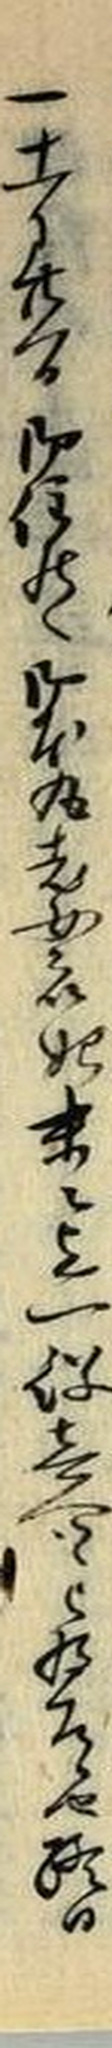一十一月廿一日御住居へ御本丸老女衆始未々迄一役壱人ツゝ被為召候由終日
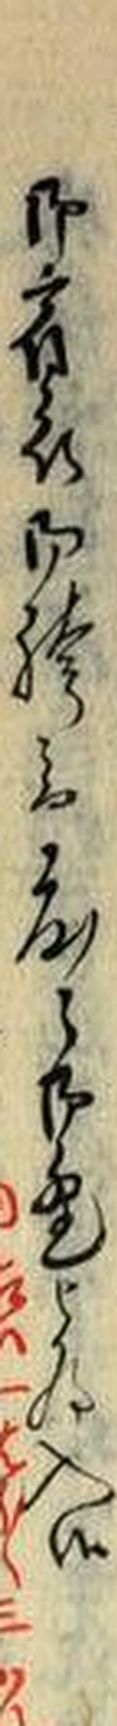御肩衣御袴ニ而度々御逢被為入候
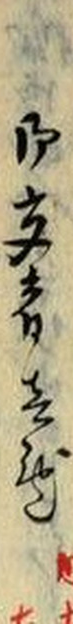御交肴壱台
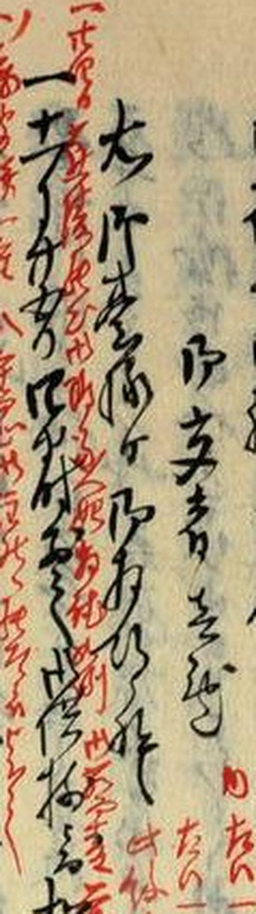右御台様ゟ御拝領被遊候
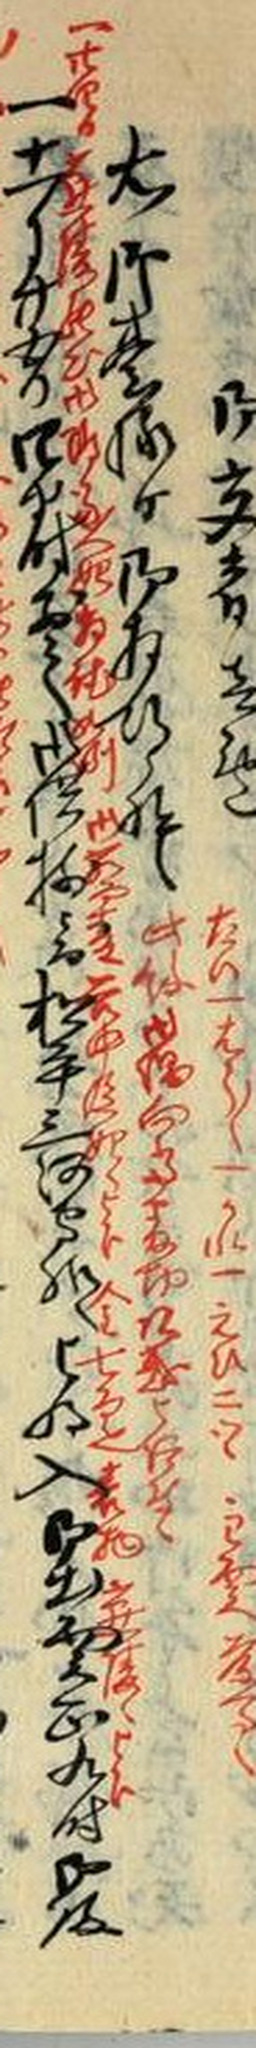一十一月廿五日四半時前之御供揃ニ而松平三河守様へ被為入御出殿正九時御帰
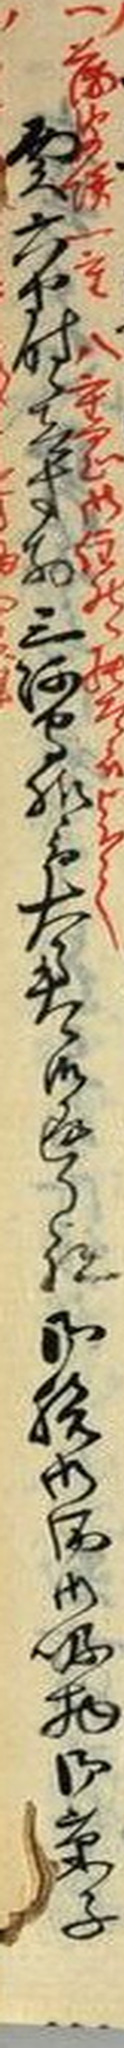殿六半時へ壱寸前三河守様ニ而大奥へ御通り被遊御膳御酒御吸物御菓子
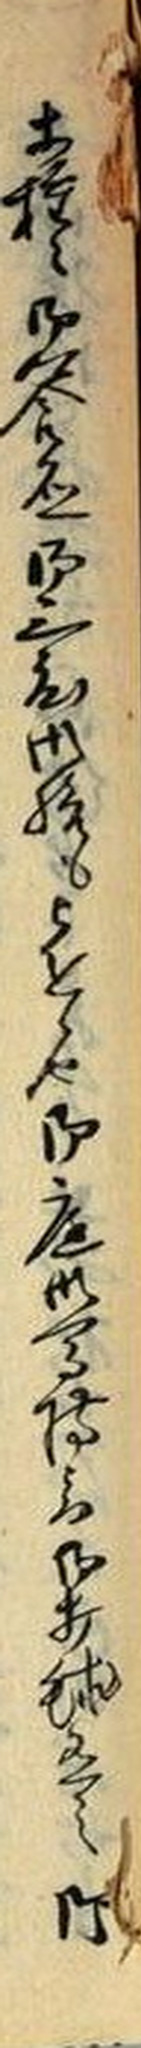等種々御饗応御三度御膳も被進候由御庭御馬場ニ而御打毬有之御
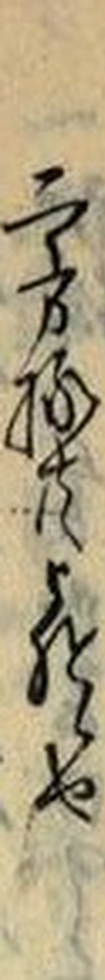二方様共被遊候由
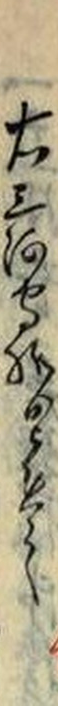右三河守様ゟ被進之
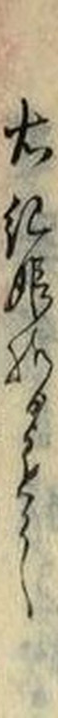右紀姫様ゟ被進之
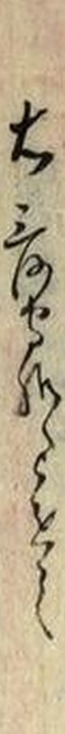右三河守様へ被進之
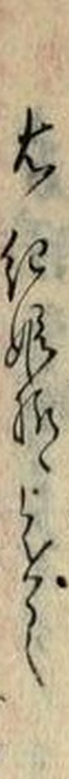右紀姫様へ被進之
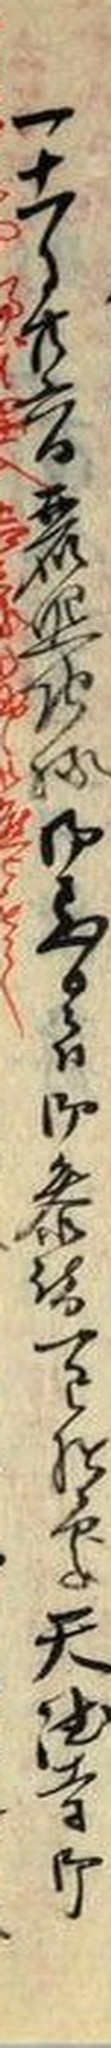一十一月廿六日麗照院様御忌日二付御参詣可被遊候処天徳寺御
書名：少傅日録抄（斉承付側向頭取日記、在府）
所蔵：福井県文書館 Fukui Prefectural Archives
